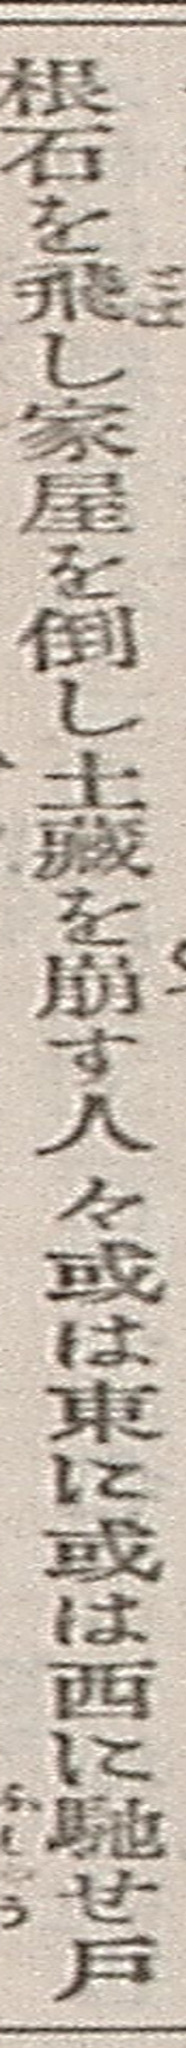根石を飛し家屋を倒し土蔵を崩す人々或は東に或は西に馳せ戸
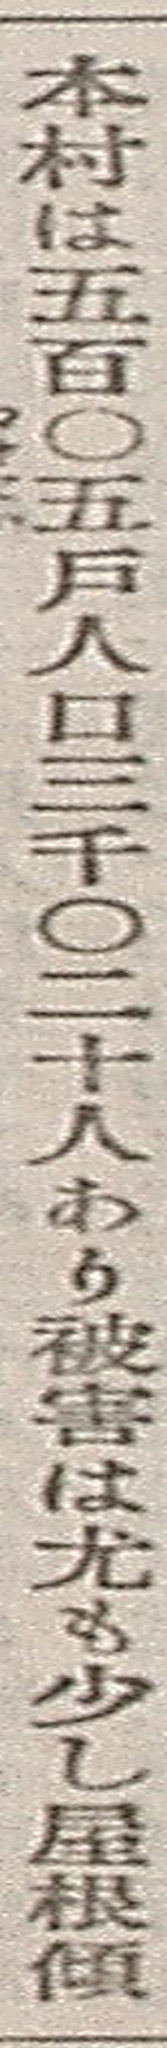本村は五百〇五戸人口三千〇二十人あり被害は尤も少し屋根傾
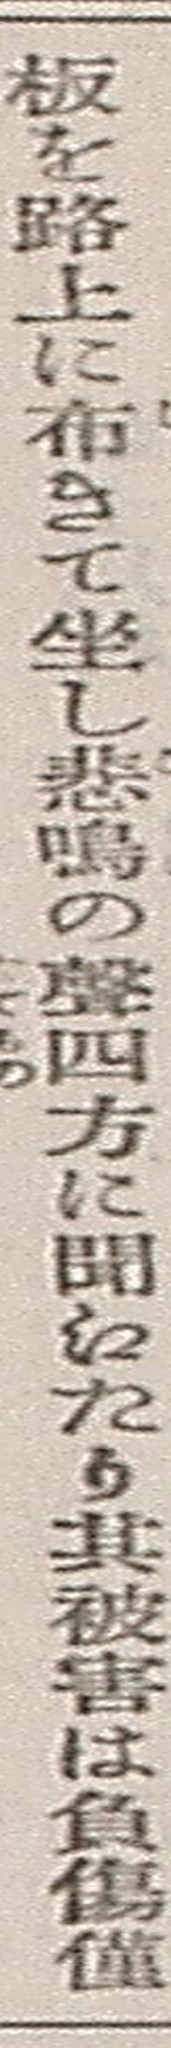板を路上に布きて坐し悲鳴の声四方に聞えたり其被害は負傷僅
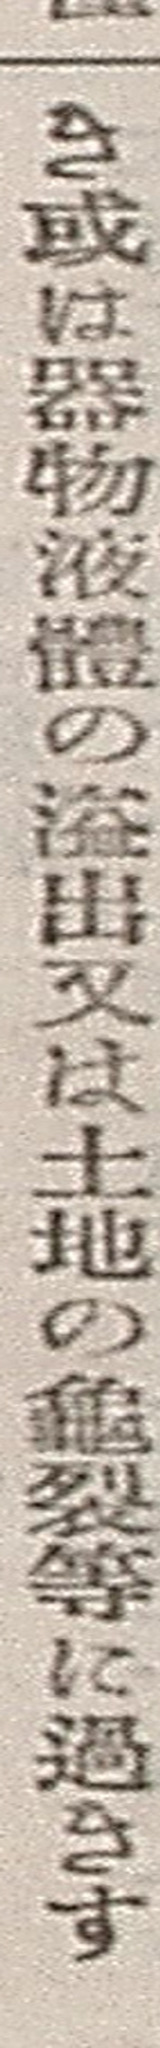き或は器物液体の溢出又は土地の亀裂等に過きす
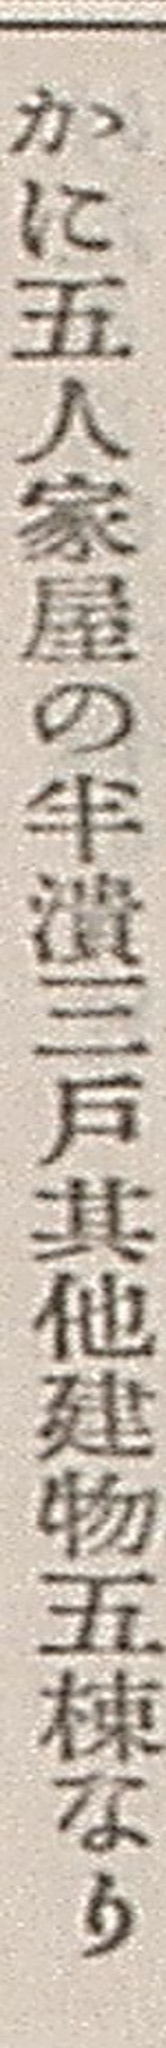かに五人家屋の半潰三戸其他建物五棟なり
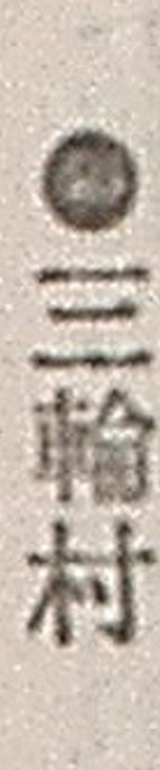●三輪村
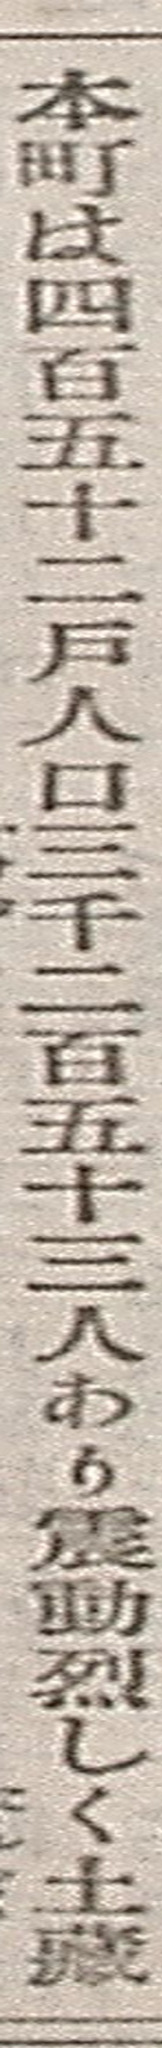本町は四百五十二戸人口三千二百五十三人あり震動烈しく土蔵
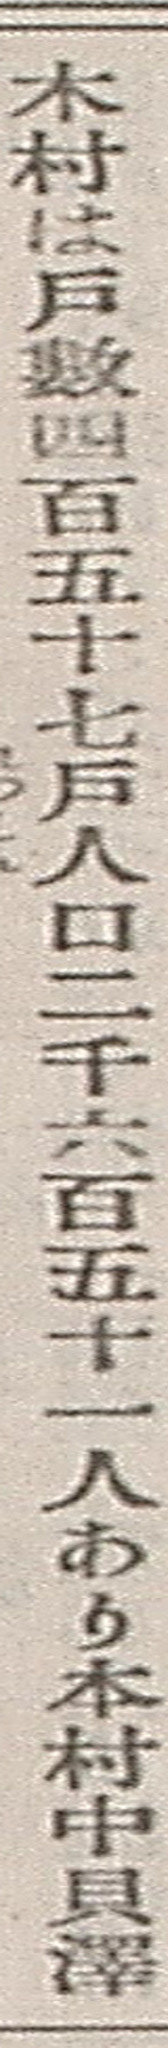本村は戸数四百五十七戸人口二千六百五十一人あり本村中貝沢
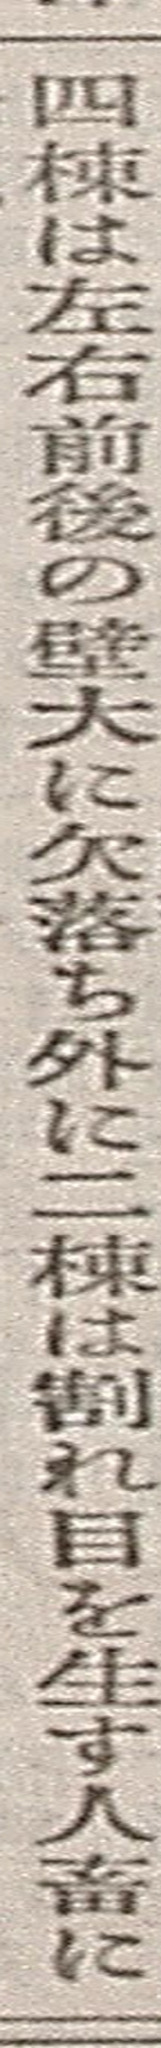四棟は左右前後の壁大に欠落ち外に二棟は割れ目を生す人畜に
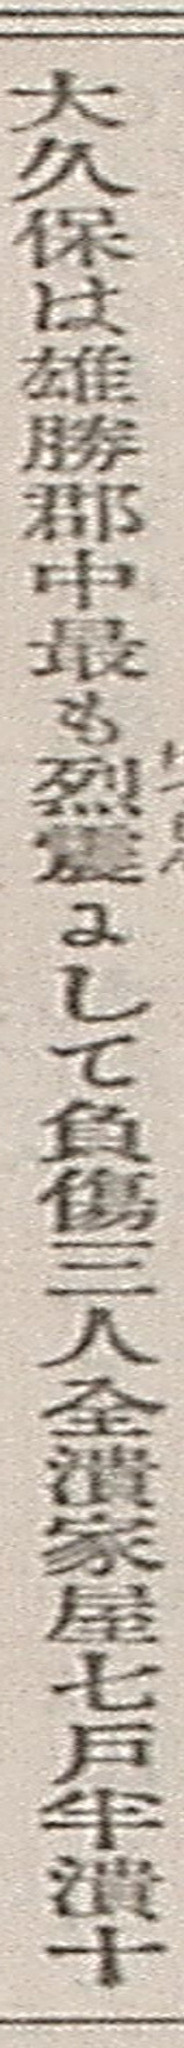大久保は雄勝郡中最も烈震にして負傷三人全潰家屋七戸半潰十
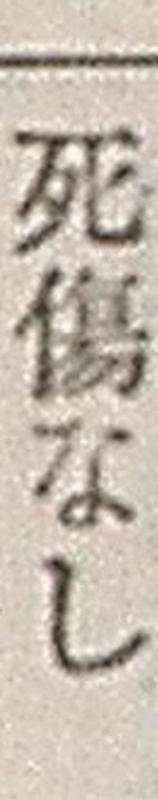死傷なし
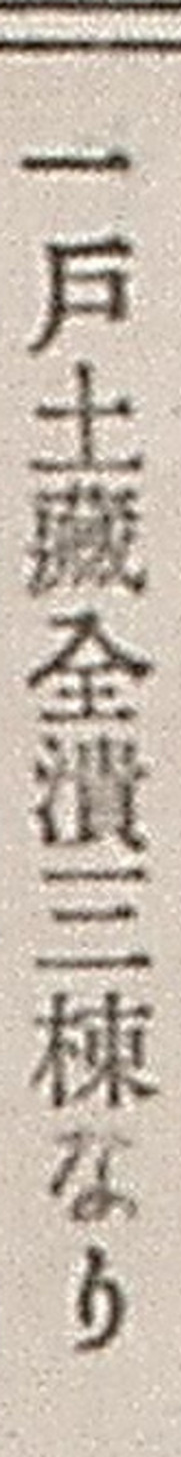一戸土蔵全潰三棟なり
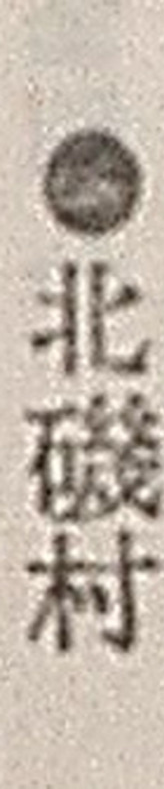●北磯村
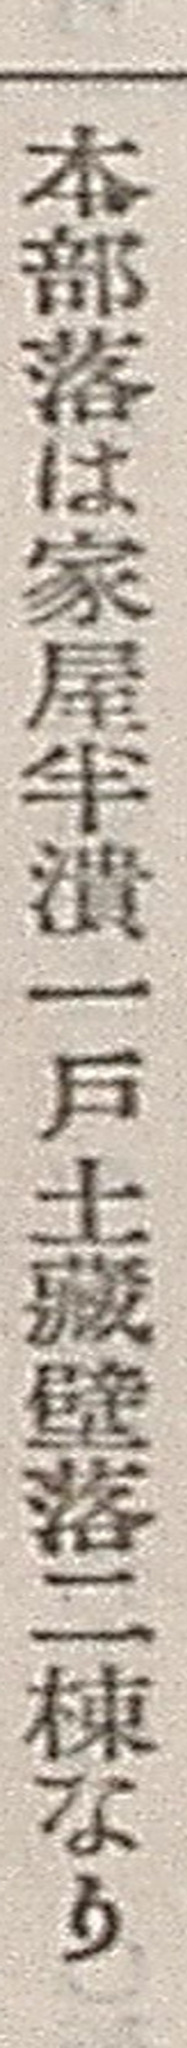本部落は家屋半潰一戸土蔵壁落二棟なり
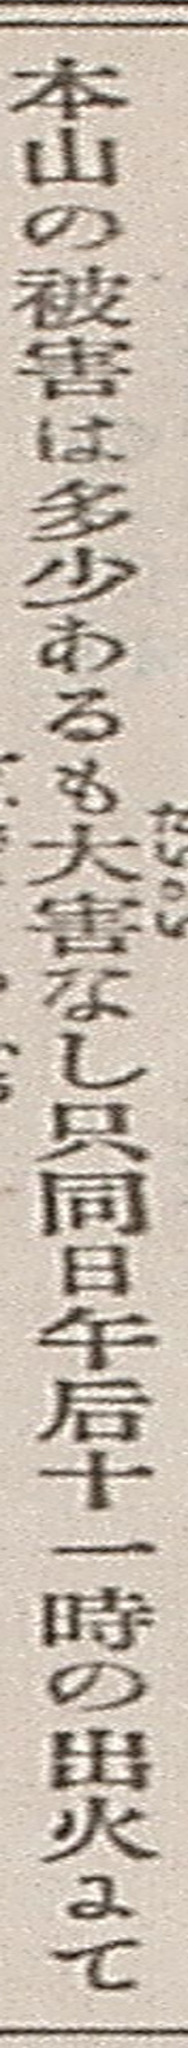本山の被害は多少あるも大害なし只同日午后十一時の出火にて
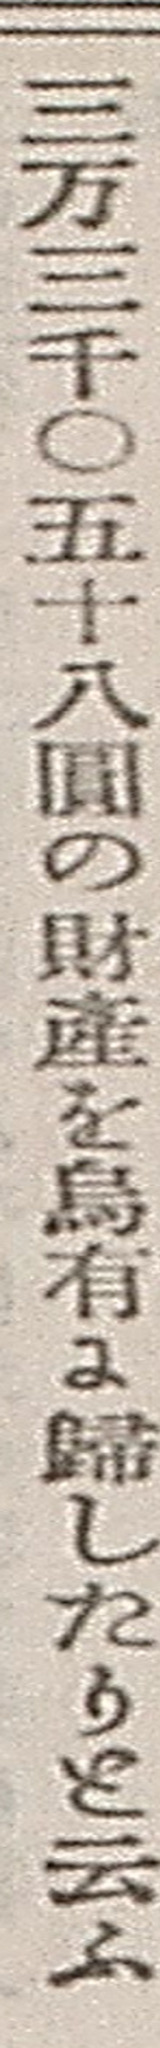三万三千〇五十八円の財産を鳥有に帰したりと云ふ
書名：風俗畫報臨時増刊第百二十四號　洪水地震被害録（上）
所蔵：東京大学地震研究所図書室 Earthquake Research Institute Library, The University of Tokyo, JAPAN
